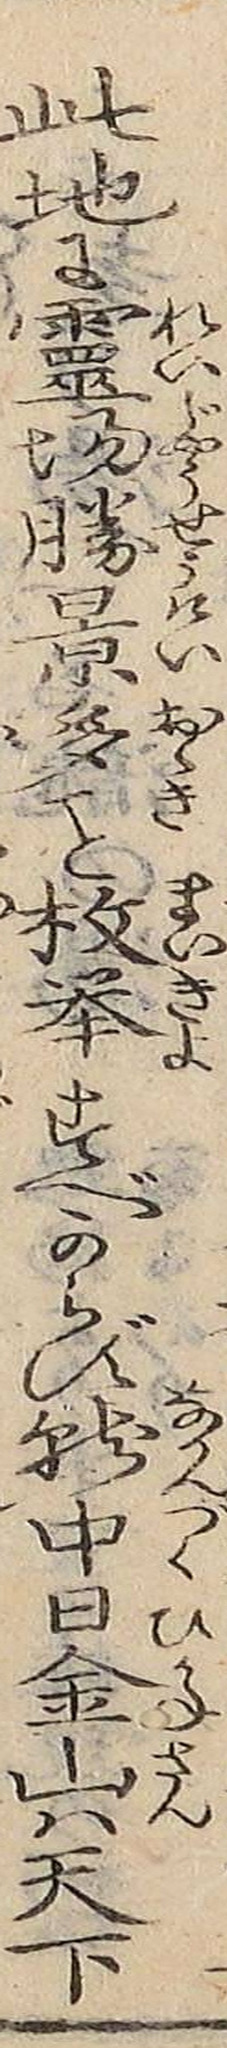此地に霊場勝景多こと枚挙すべからず就中日金山は天下
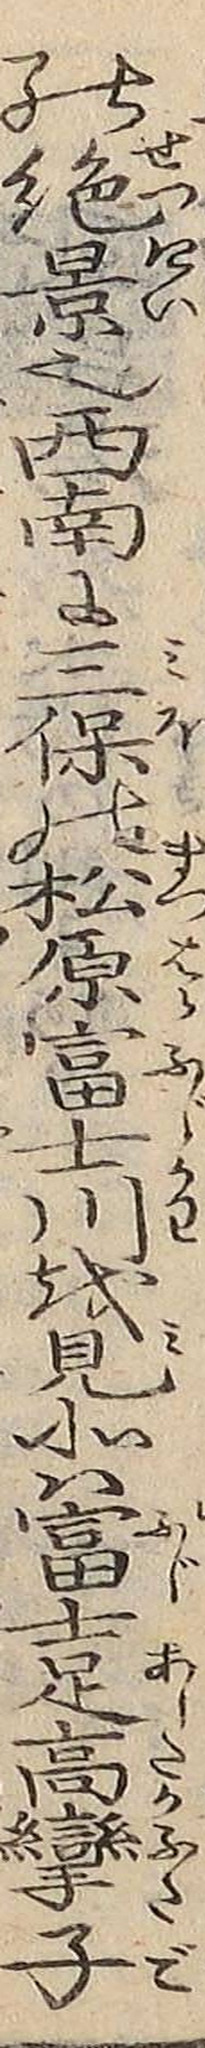の絶景也西南に三保の松原富士川を見北は富士足高攣子
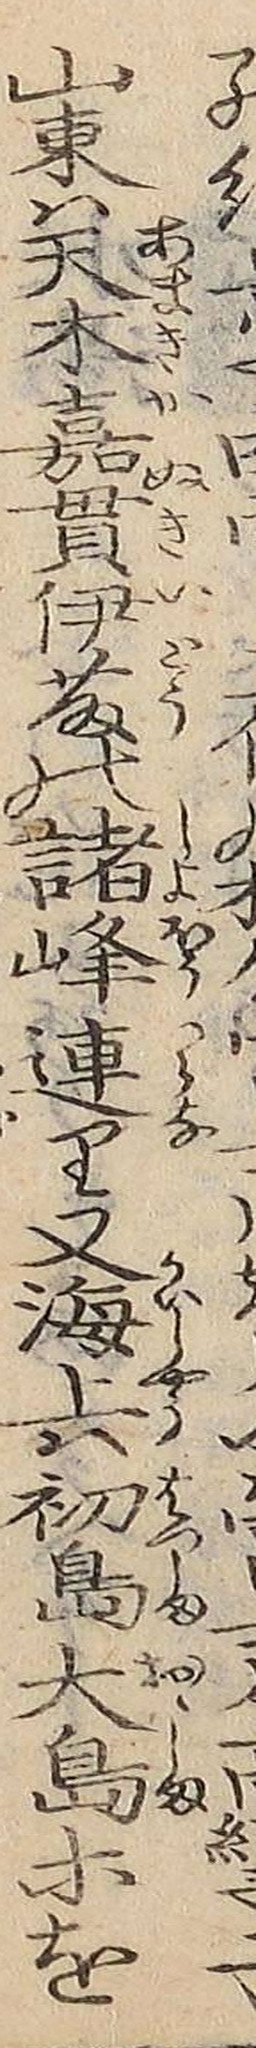山東は天木嘉貫伊藤の諸峰連り又海上は初島大島等を
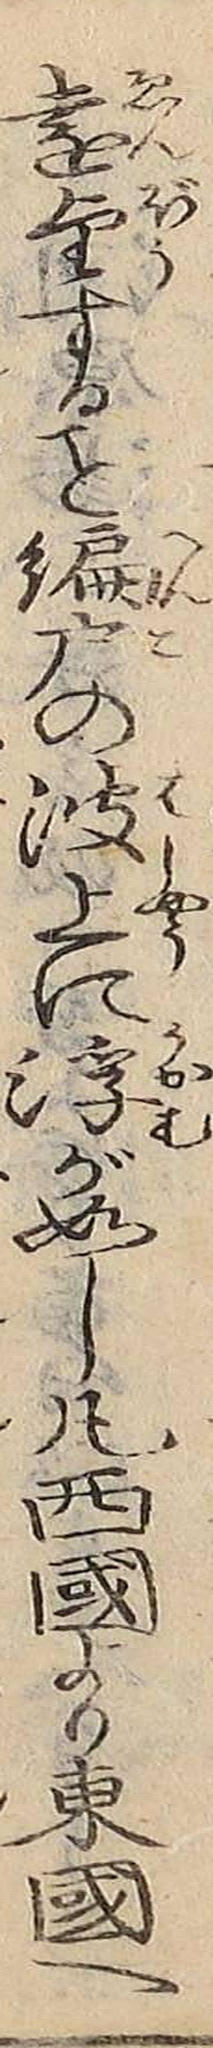遠望すること編戸の波上に浮が如し凡西国より東国へ
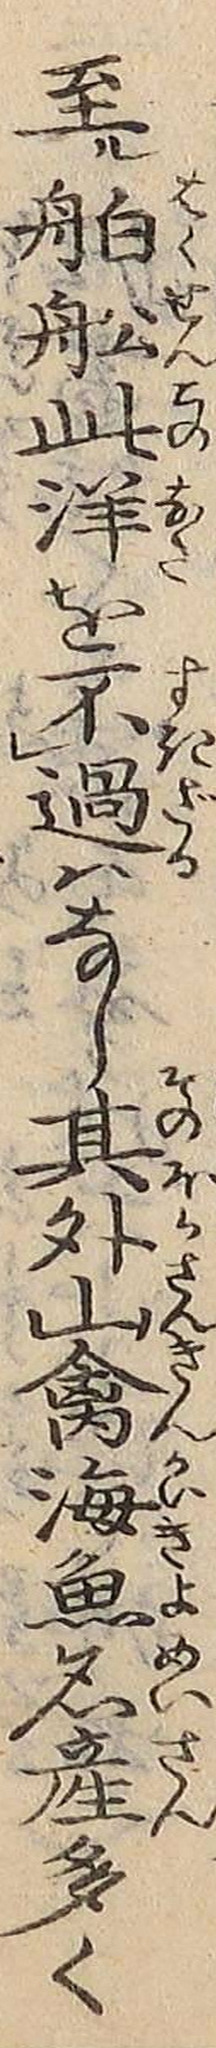至舶船此洋を不過はなし其外山禽海魚名産多く
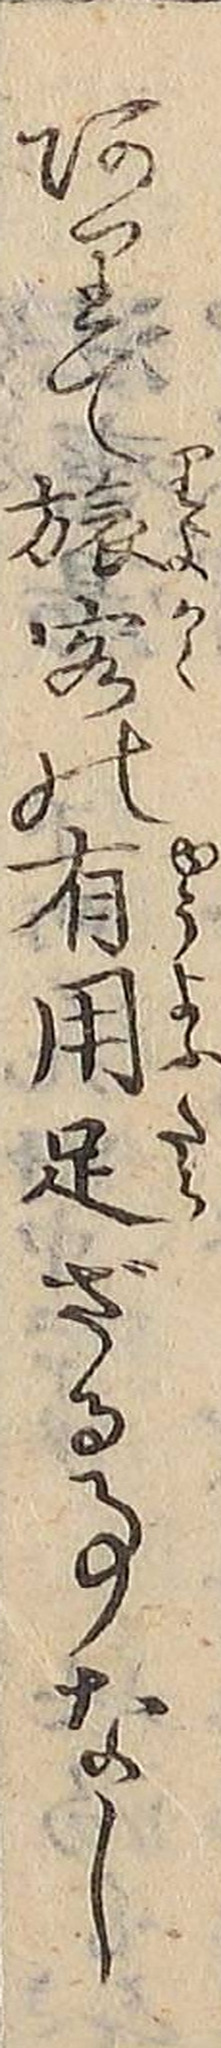ありて旅客の有用足ざる事なし
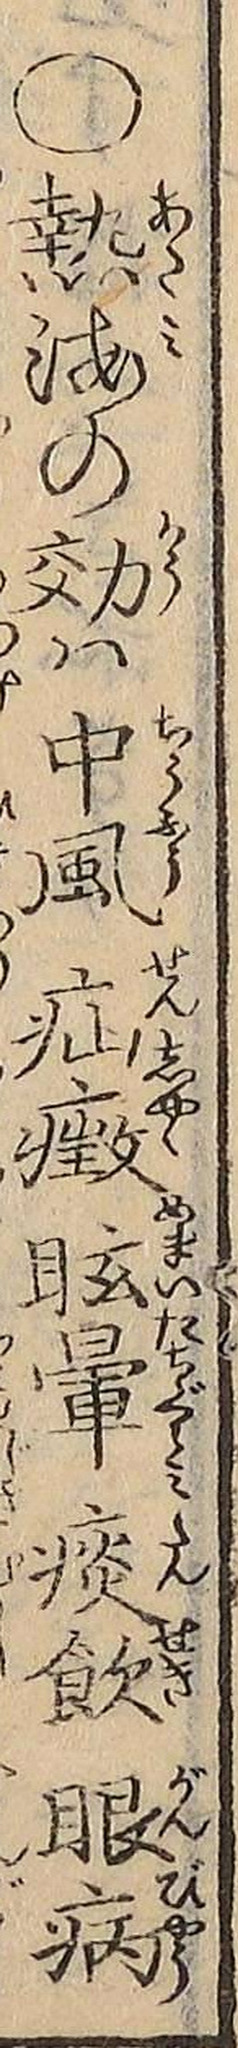○熱海の効は中風疝癥眩暈痰飲眼病
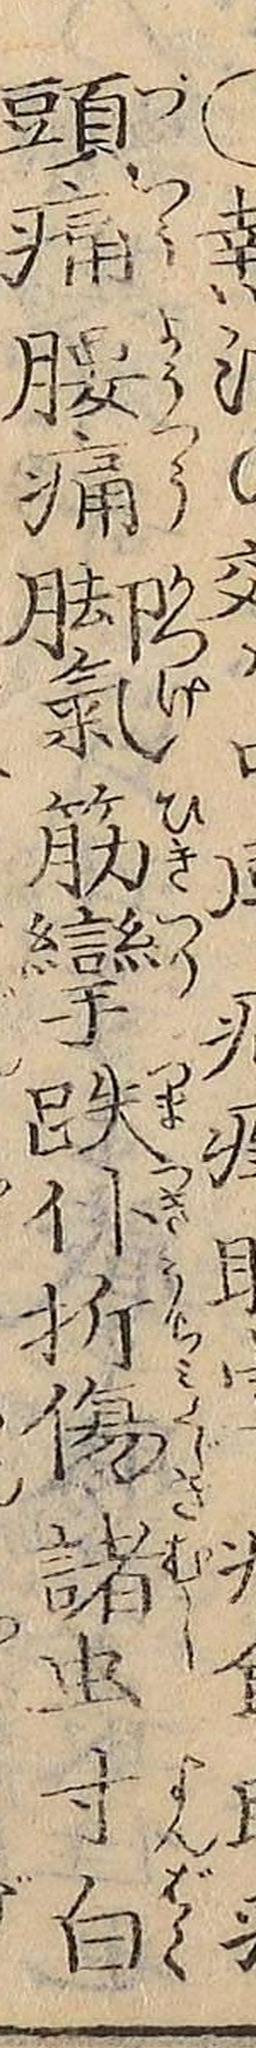頭痛腰痛脚気筋攣跌仆折傷諸虫寸白
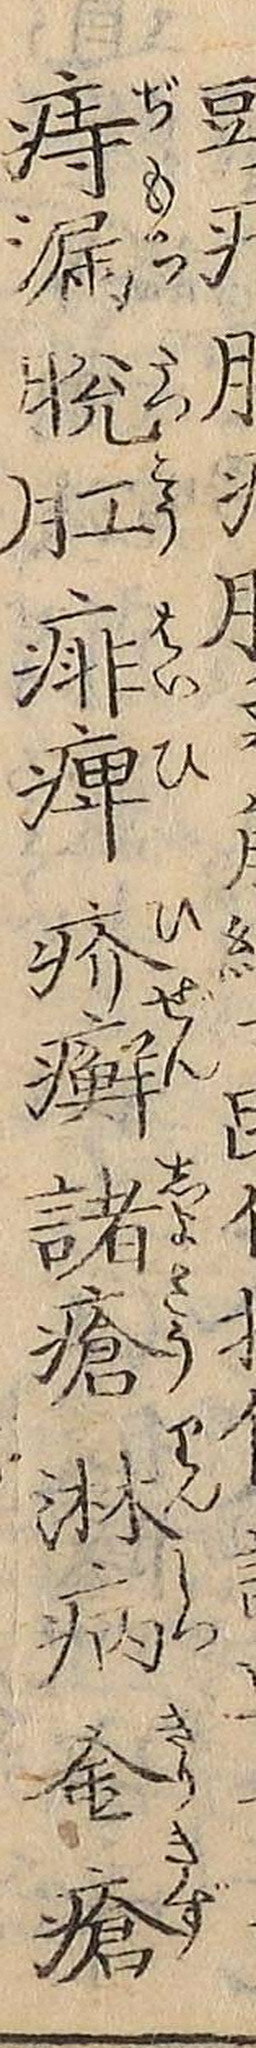痔漏脱肛痱痺疥癬諸瘡淋病金瘡
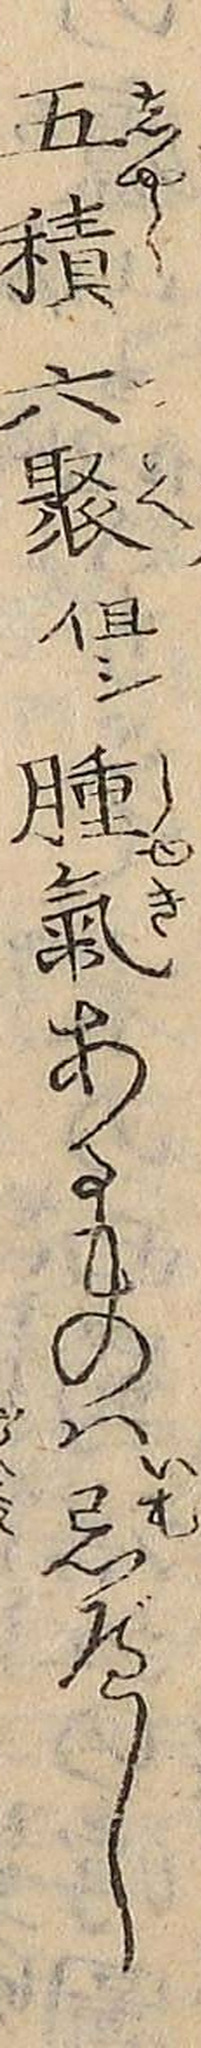五積六聚但シ腫気あるものは忌べし
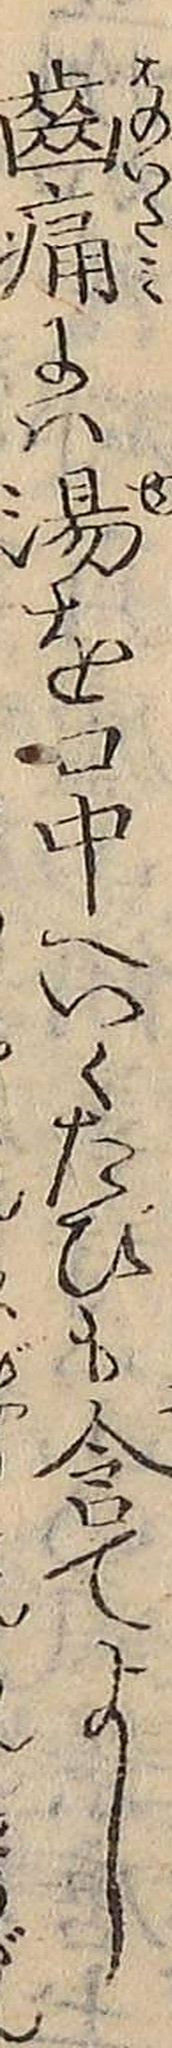歯痛には湯を口中へいくたひも含てよし
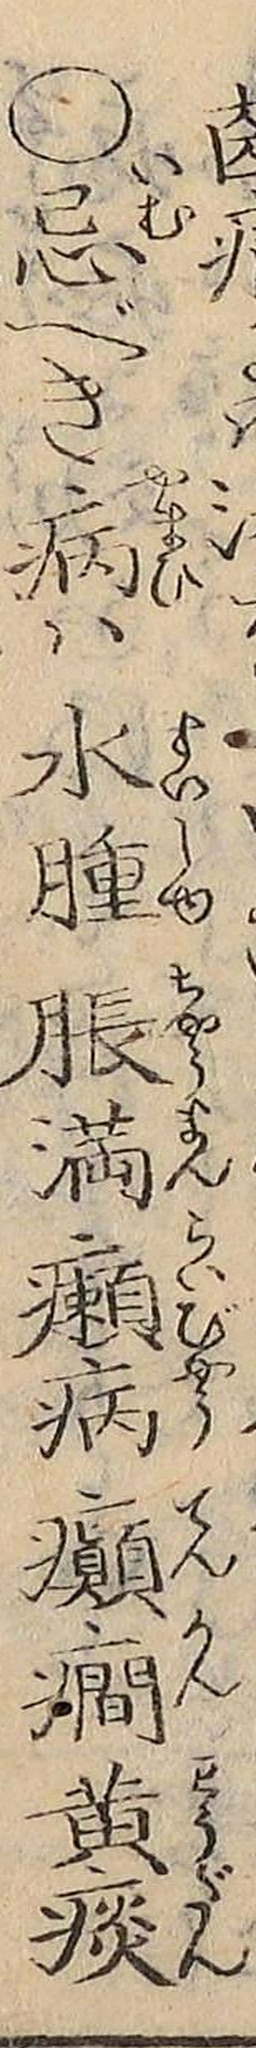○忌べき病は水腫張満癩病癲癇黄痰
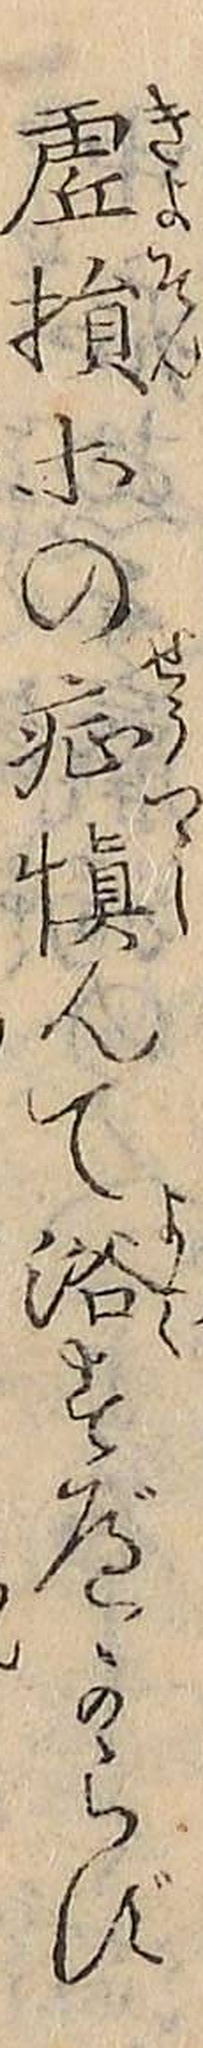虚損等の症慎んて浴すべからず
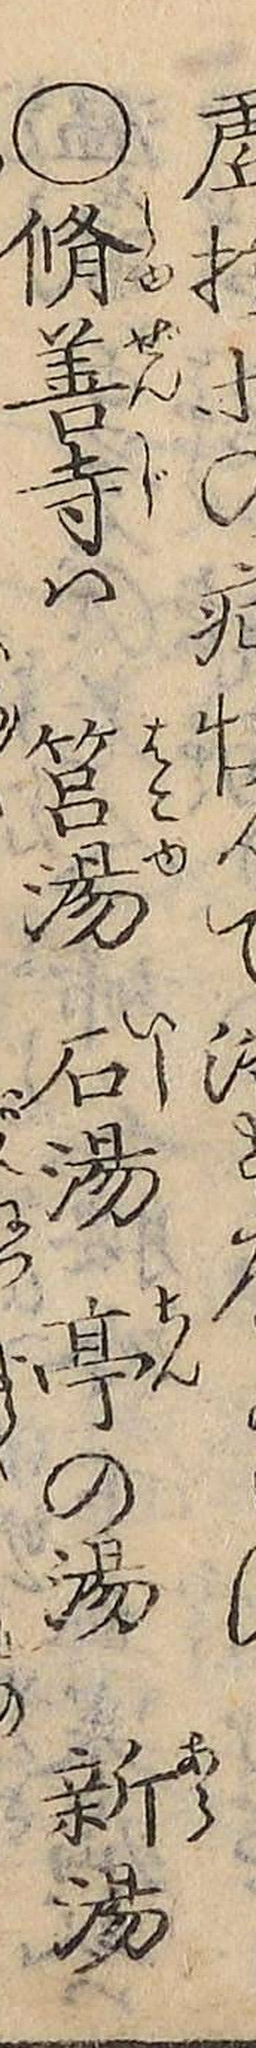○脩善寺は筥湯石湯亭の湯新湯
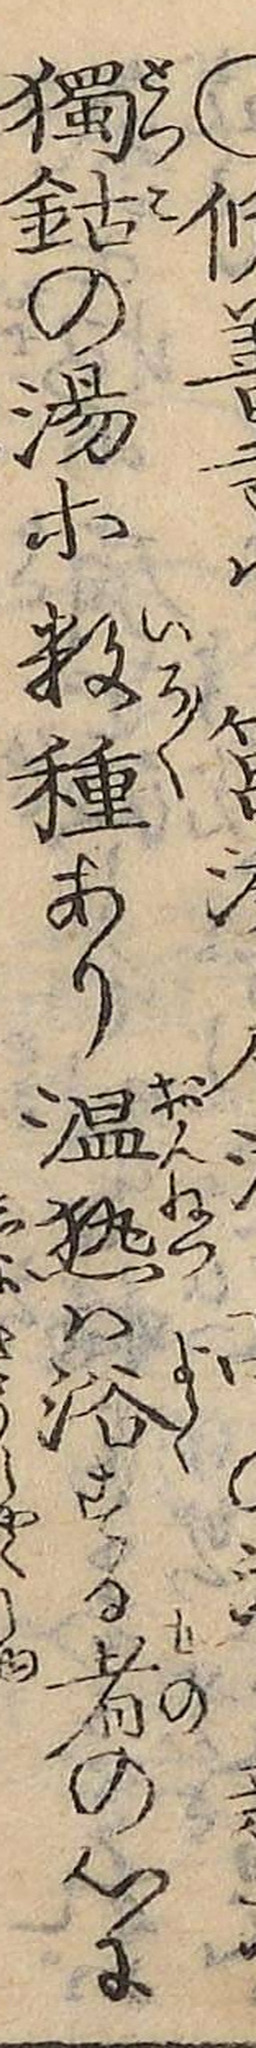独鈷の湯等数種あり温熱は浴する者の心に
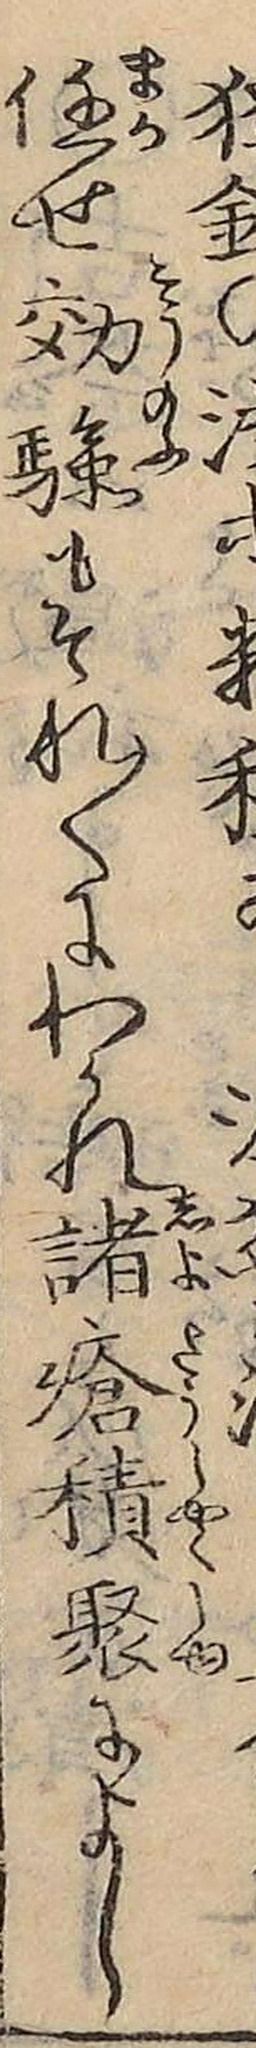任せ効験もそれ〳〵にわかれ諸瘡積聚によし
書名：旅行用心集
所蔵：神戸大学附属図書館 国文学研究資料館
